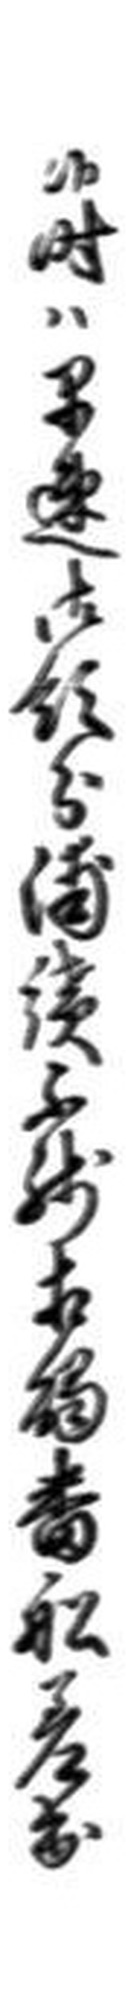候時ハ早速御領分浦続不残相触番船差出
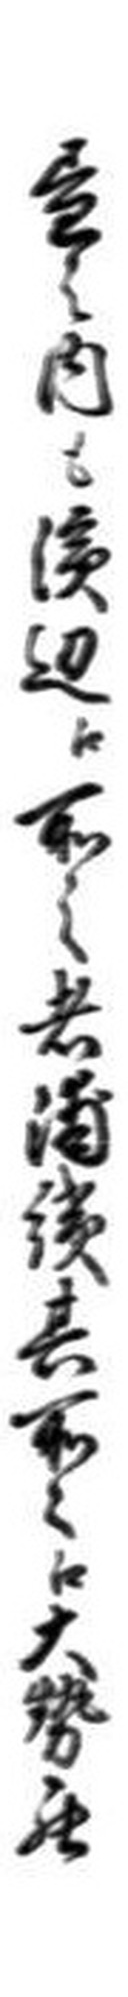昼之内も浜辺江所之者浦続其所々江大勢罷
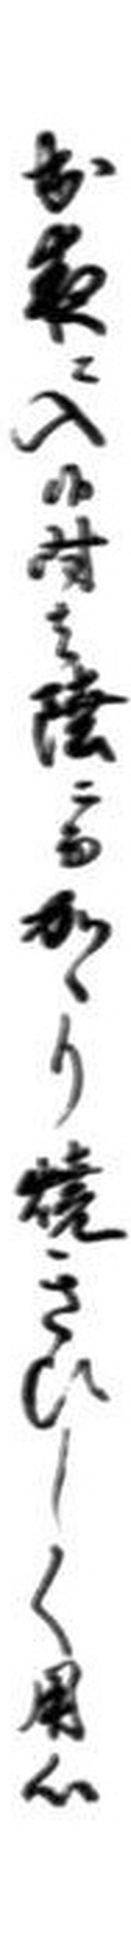出夜ニ入候時者陸ニ而かかり焼きひしく用心
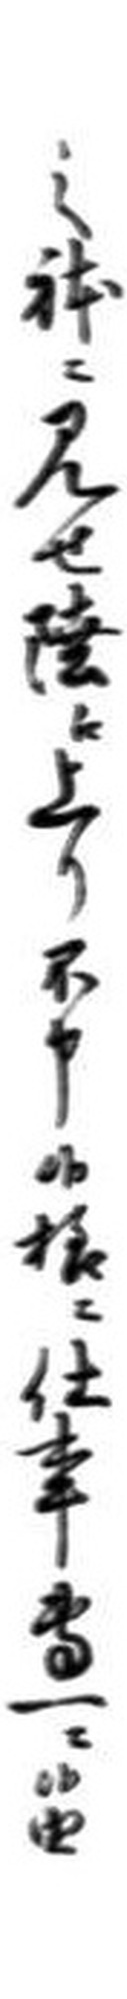之体ニ見せ陸江上り不申候様ニ仕事専一ニ候由
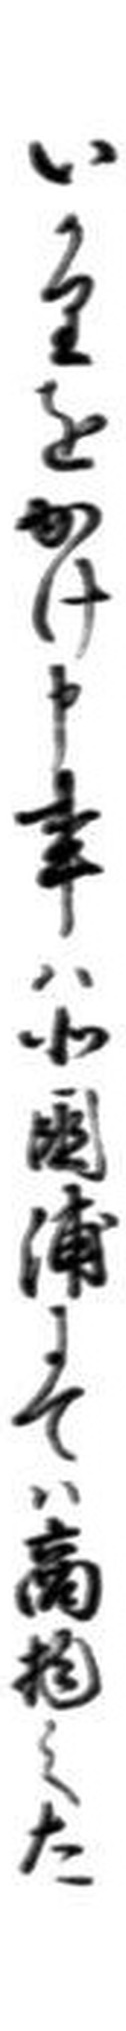いかりをかけ申事ハ北国浦にてハ商物之た

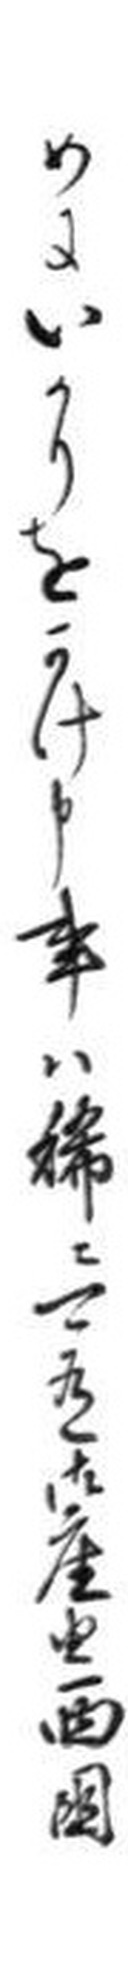めにいかりをかけ申事ハ稀ニ可有御座由西国
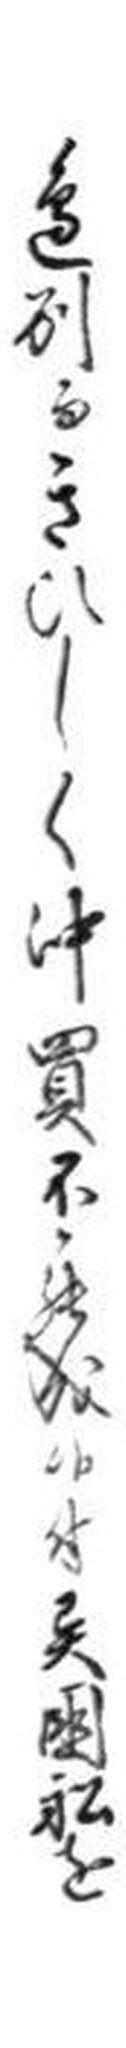辺別而きひしく沖買不罷成候付異国船を
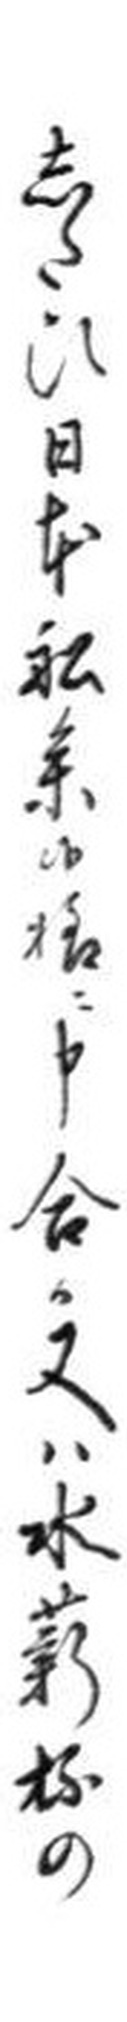したひ日本船参候様ニ申合か又ハ水薪抔の
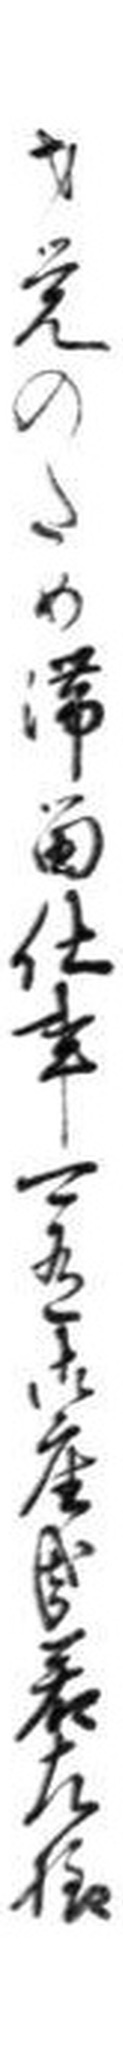才覚のため滞留仕事可有御座哉若左様
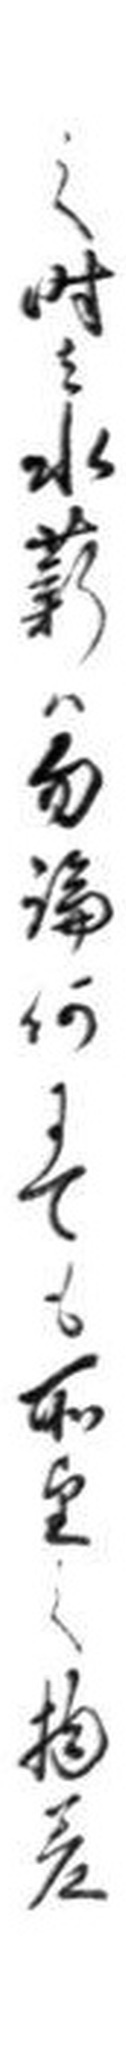之時者水薪ハ勿論何にても所望之物差
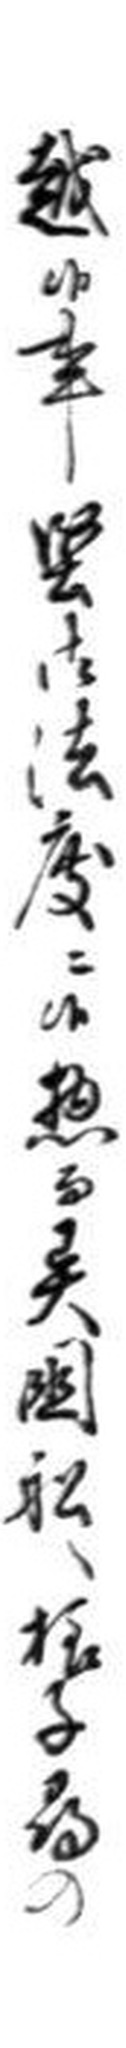越候事堅御法度ニ候惣而異国船へ様子尋の
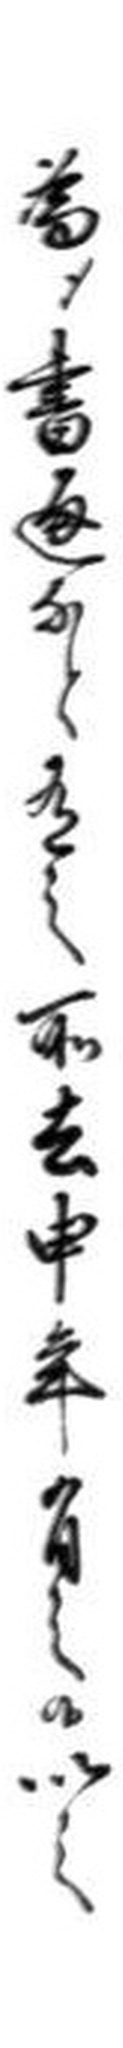為メ書通なと有之所去申年有之候以之
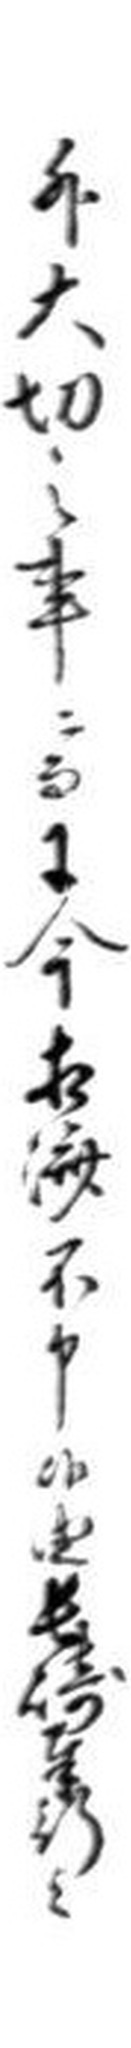外大切之事ニ而于今相済不申候由長崎奉行与
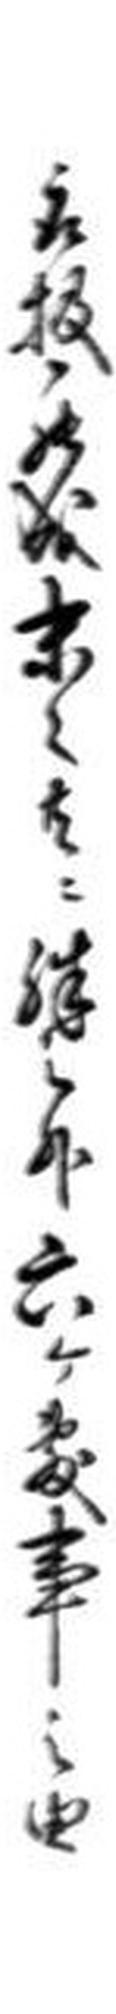取扱罷成末々共ニ殊之外六ケ敷事之由
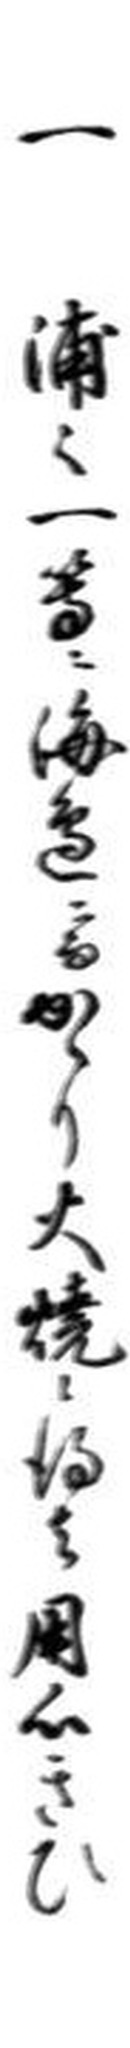一浦々一等ニ海辺ニ而かかり火焼候得者用心きひ
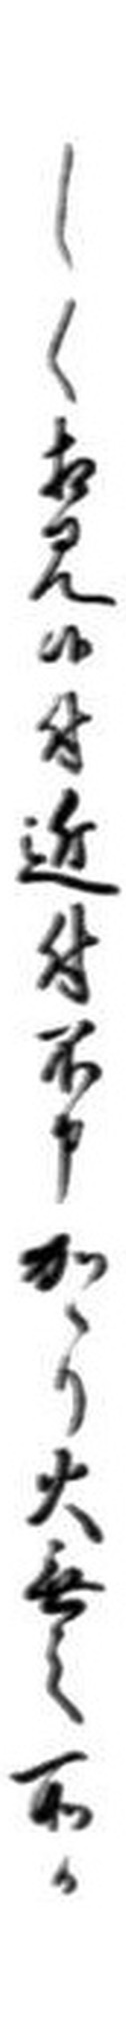しく相見候付近付不申かかり火無之所か
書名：家譜 三十二 吉邦公 従享保二年到享保三年
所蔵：福井県文書館 Fukui Prefectural Archives
